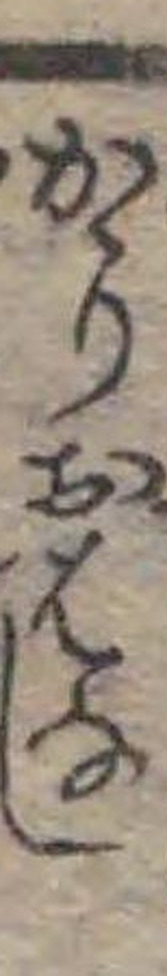かゝりおはなし
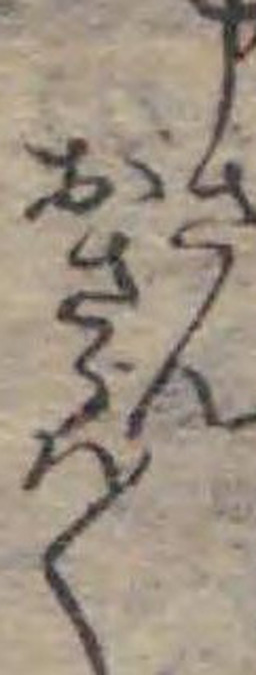おさらば〳〵
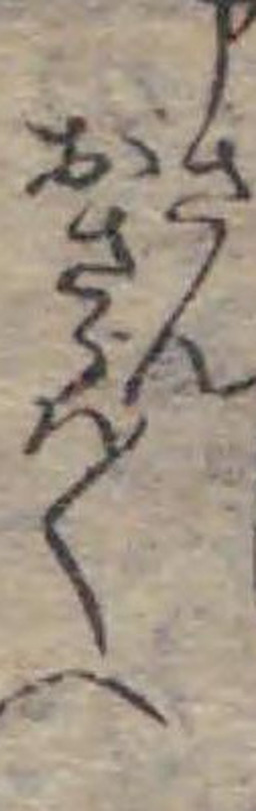おさらば〳〵
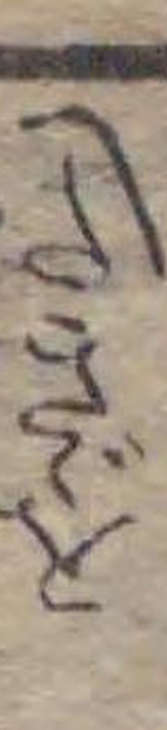〽たきゞを
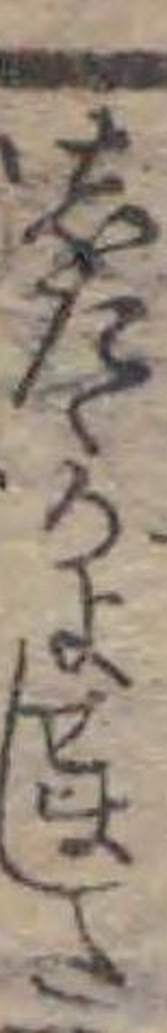したゝかよせました
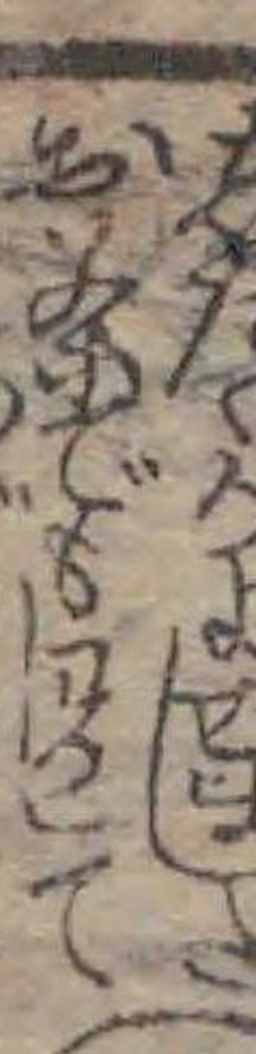お茶でもわかして
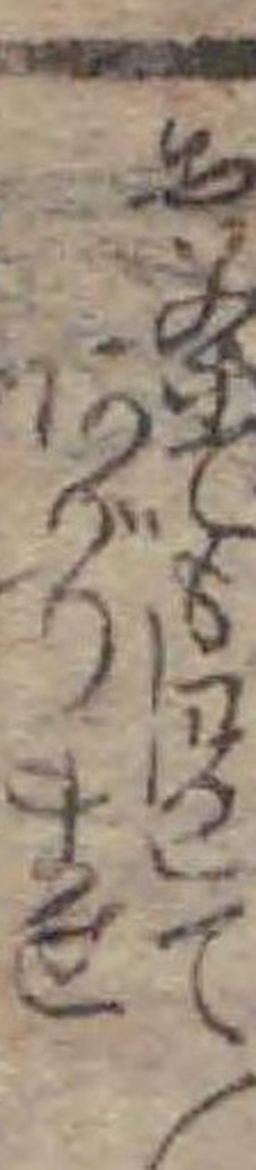あがりませ
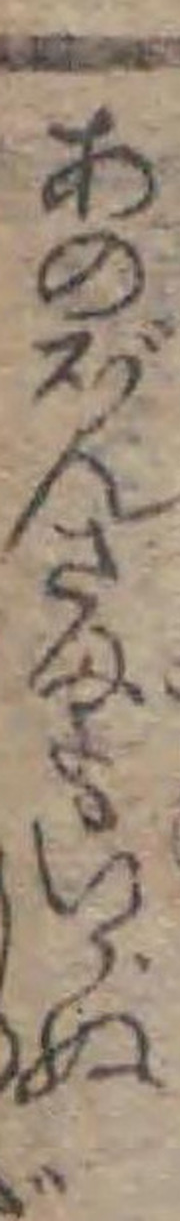あのぼんさまもいらぬ

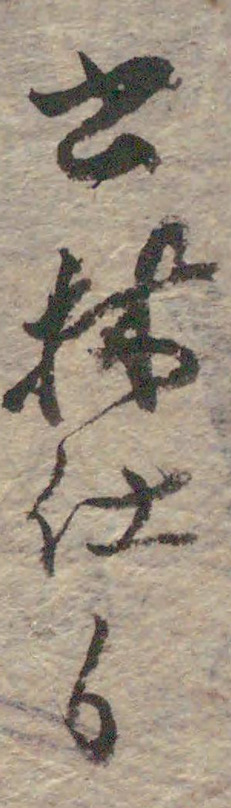書林仕候

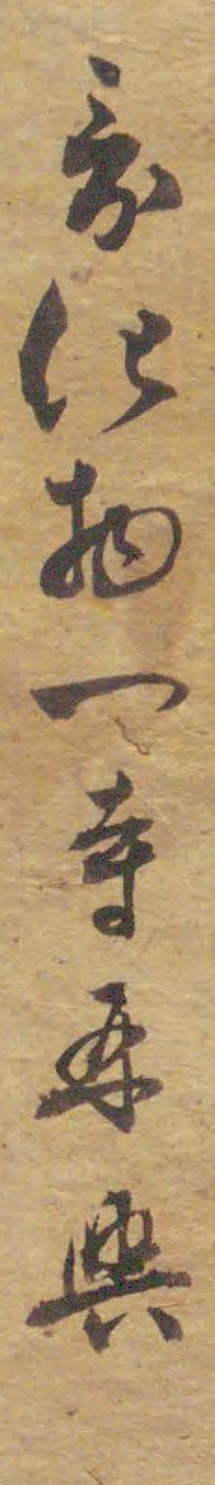歌化物一寺再興下

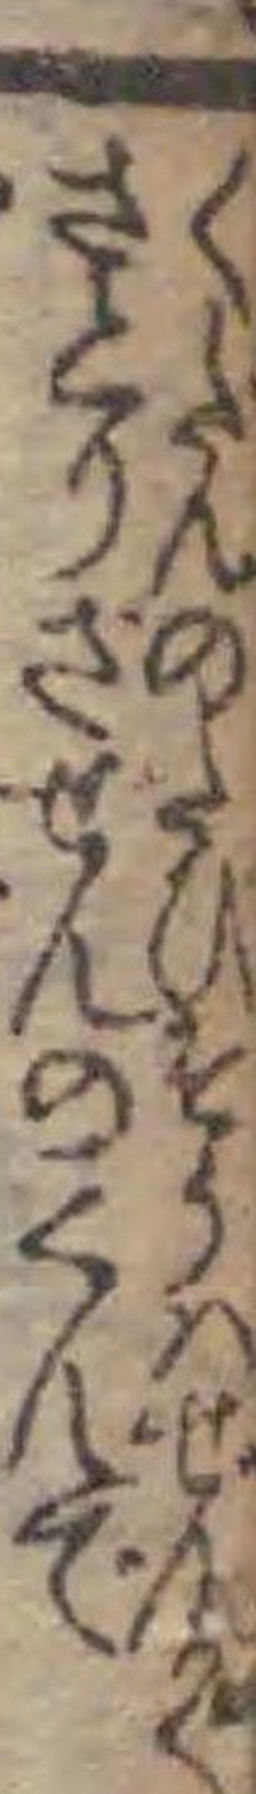さとりざぜんのくんで
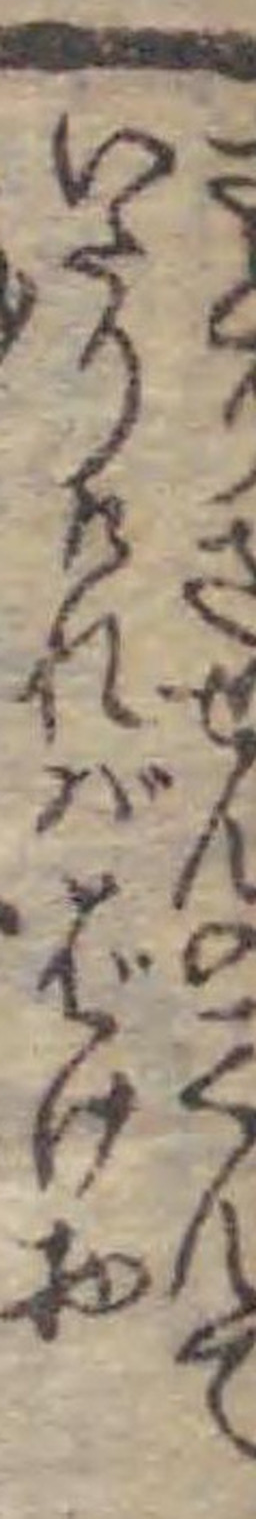いたりければばけ物
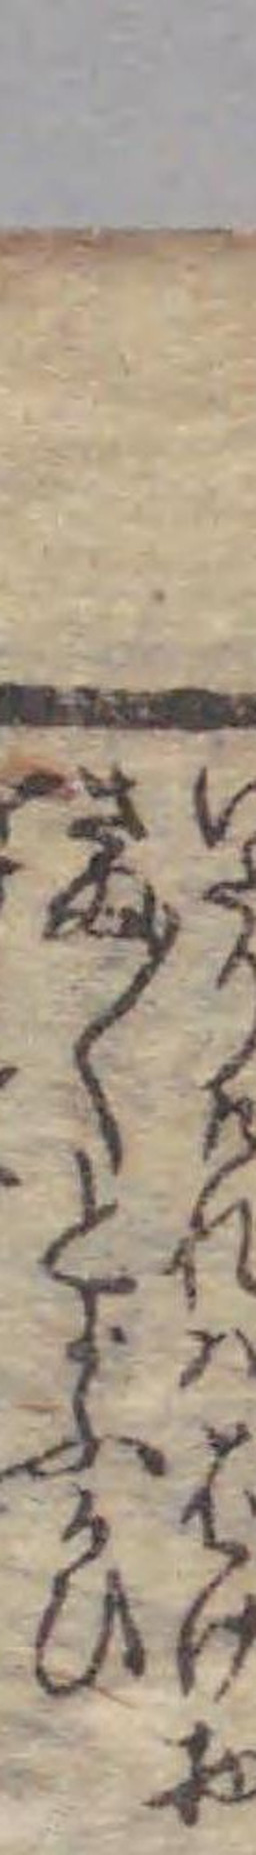さま〳〵とよふかひ
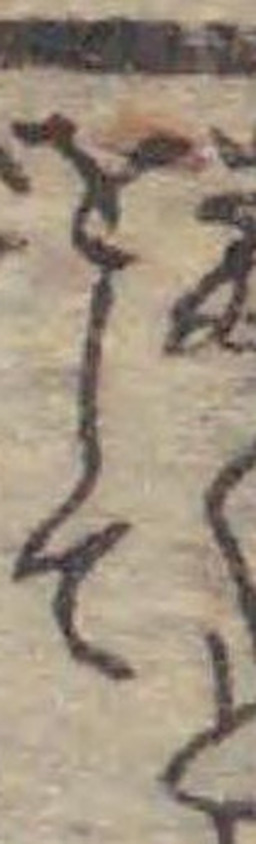をして
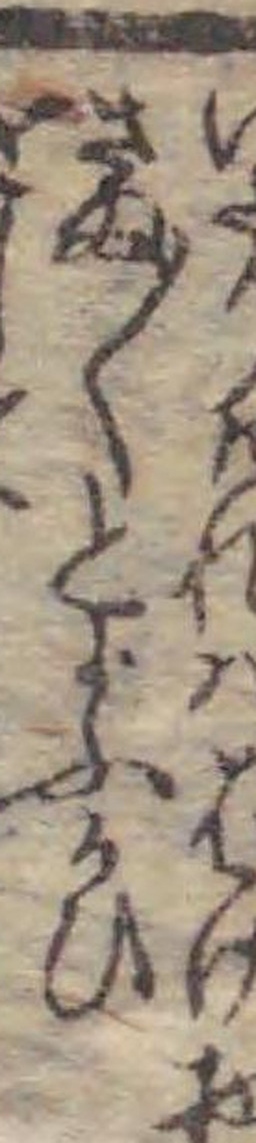さま〳〵とよふかひ
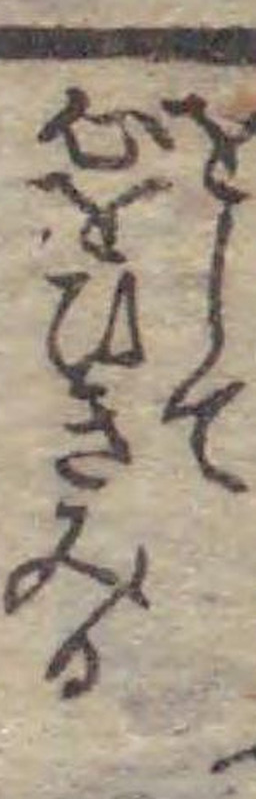心をひきみる
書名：歌の化物一寺再興 : 2巻
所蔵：国立国会図書館 National Diet Library, JAPAN
